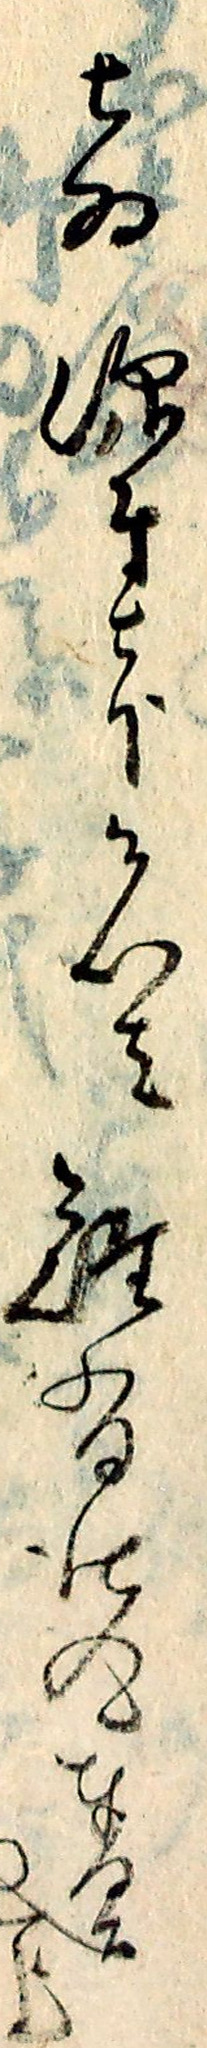被為仰付被下候はは難有仕合奉存上臈已上
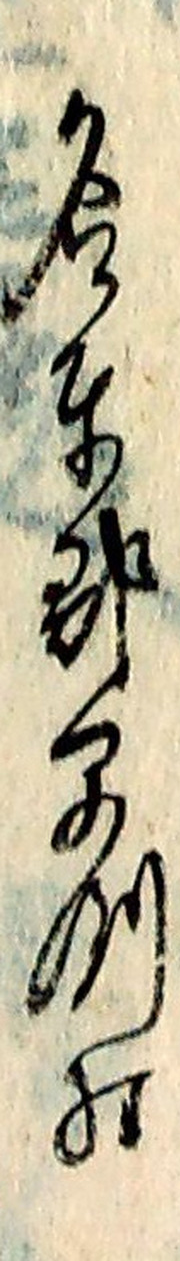名東郡早淵村
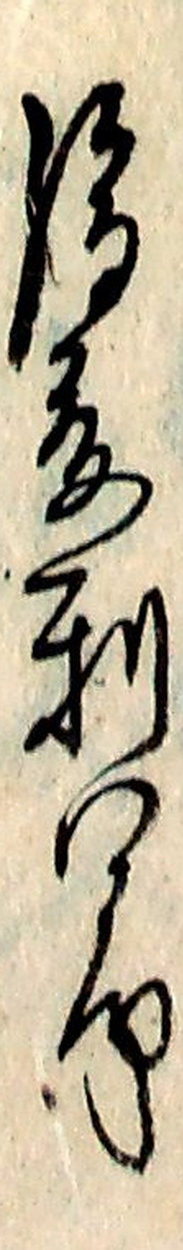後藤利八郎
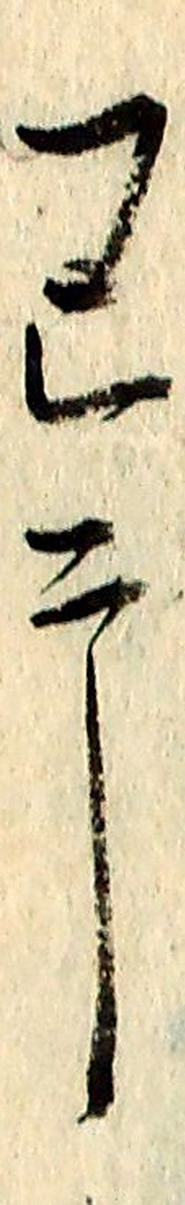巳二月
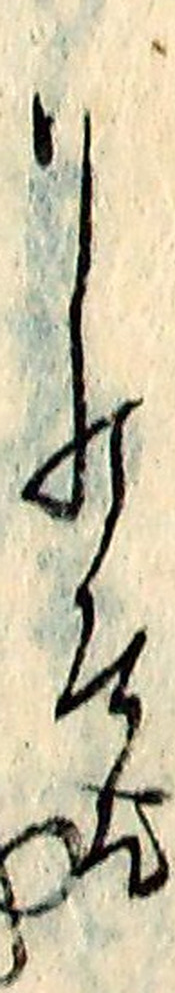同村庄屋

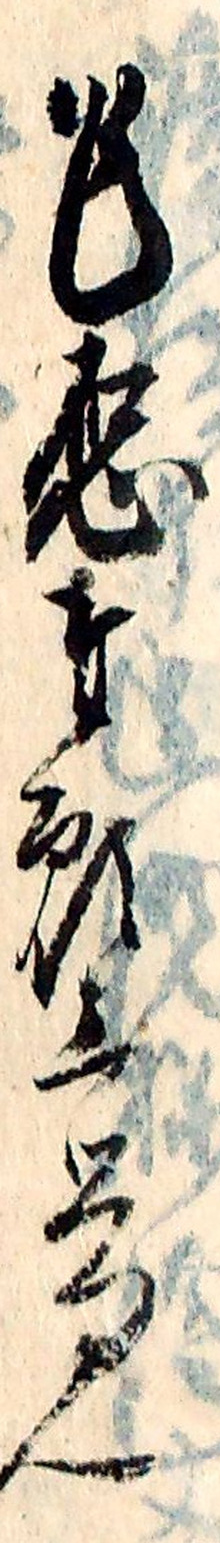乍恐奉願上覚
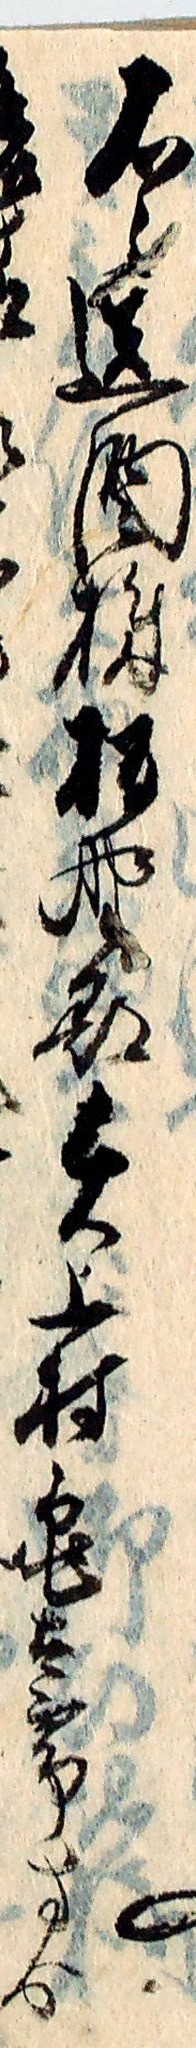右之造酒株板野郡矢上村亀太郎方ゟ
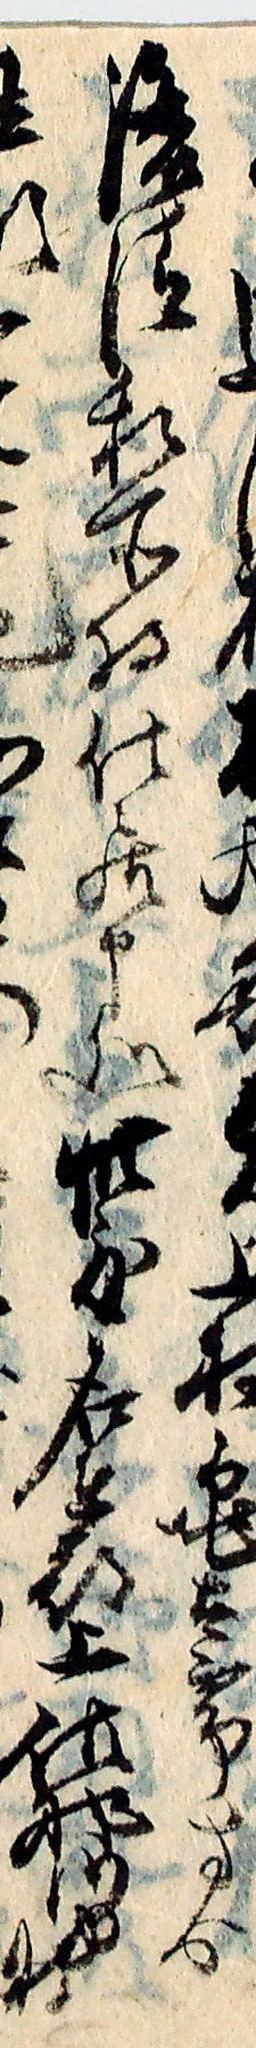譲請私所持仕居申処此度名東郡上佐那河内村
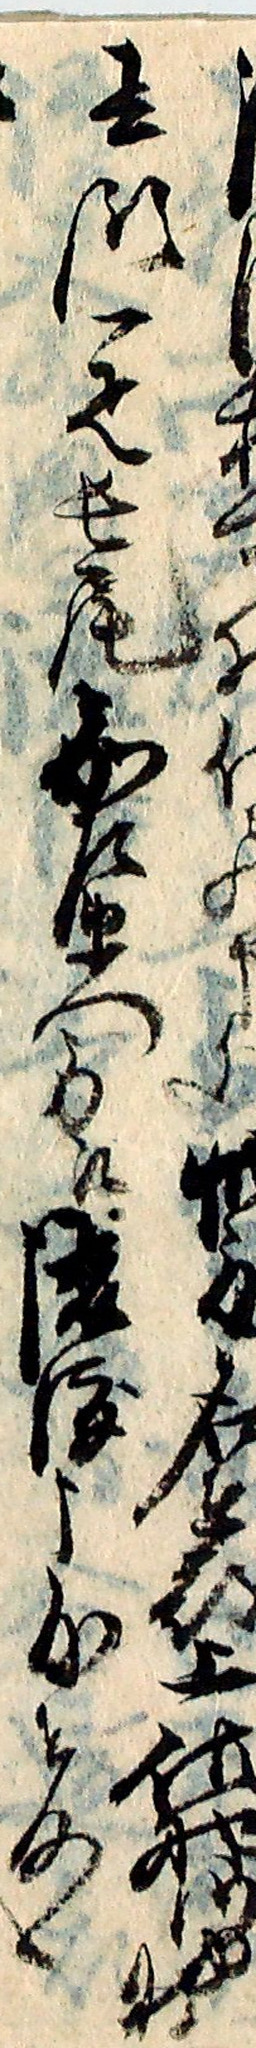壱領一疋長尾嘉左衛門方え譲渡申度奉存候
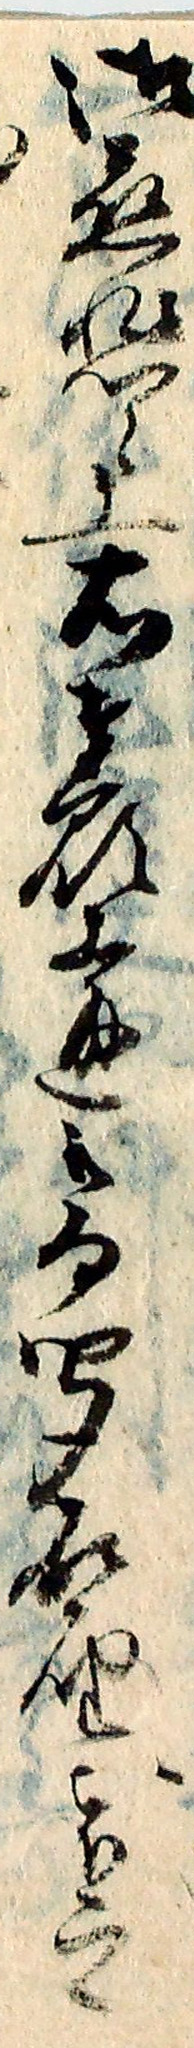御慈悲之上右奉願上通被為聞召届被下候はゝ
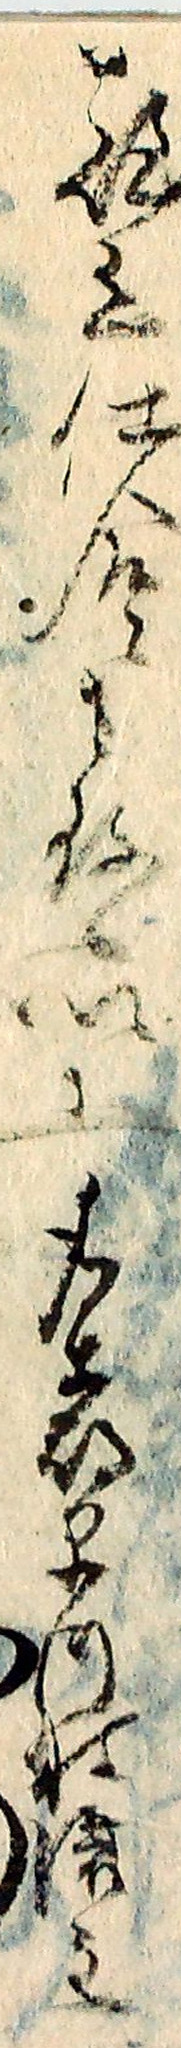難有仕合に奉存候以上名東郡早淵村譲主
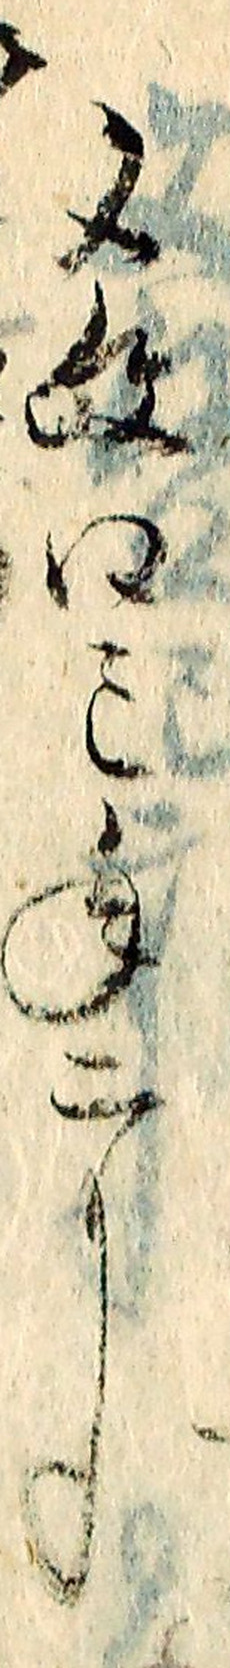文政四巳年二月
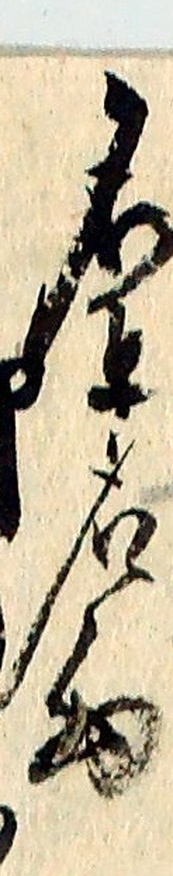名東名西
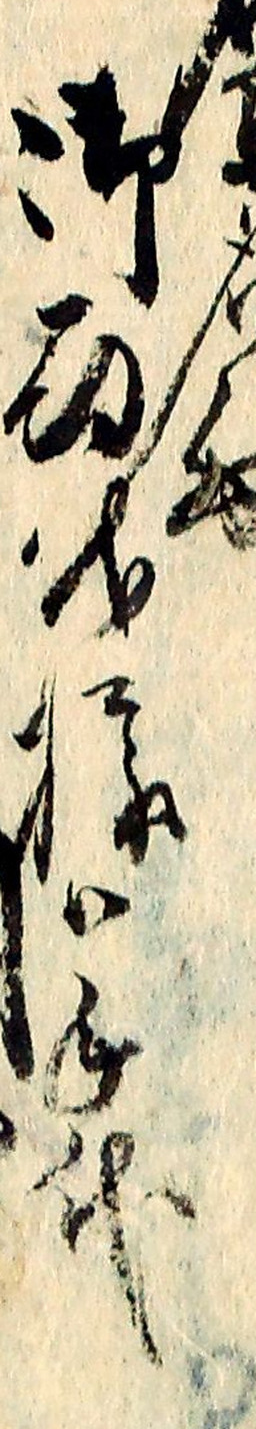御郡代様御手代
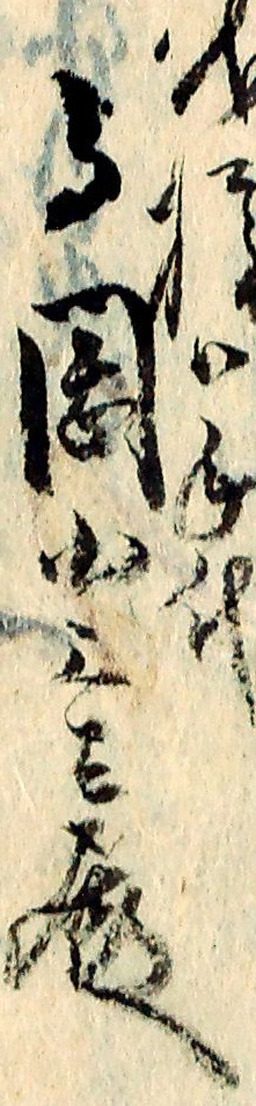高岡小三太殿
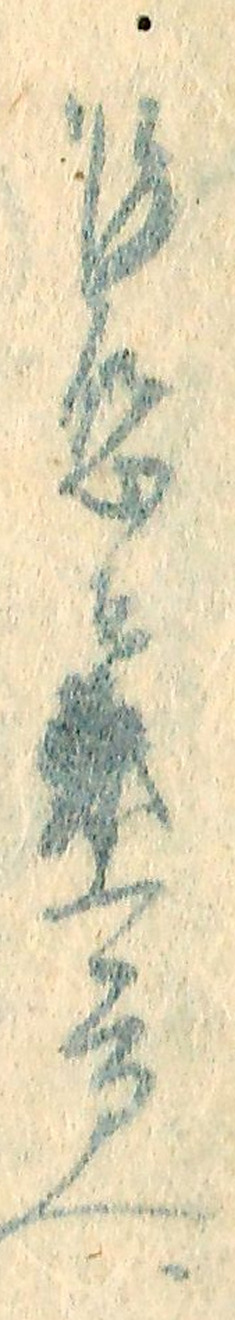乍恐奉願上覚
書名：諸御願書控(後藤氏壱番）
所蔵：鳴門教育大学 Naruto University of Education
